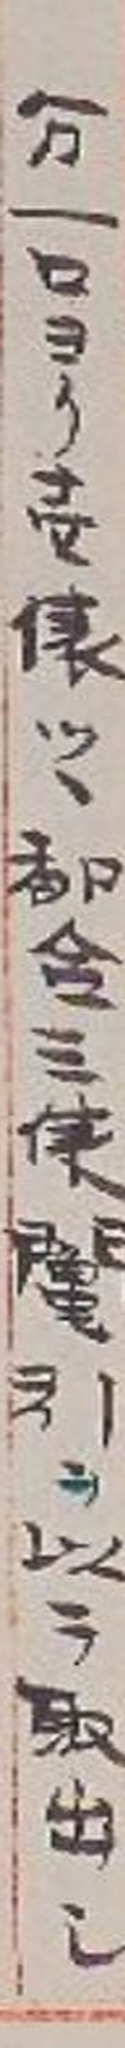分一口ヨリ壱俵ツヽ都合三俵鬮引ヲ以テ取出シ
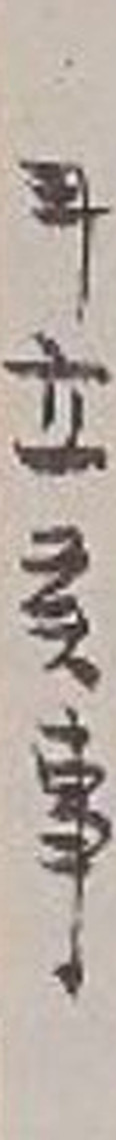斗立候事
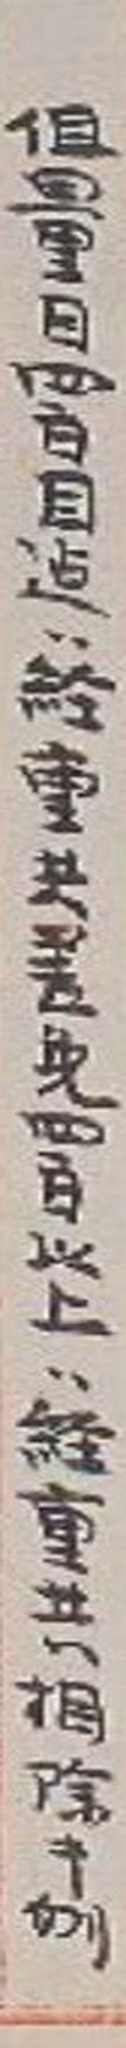但量目四百目迄ハ経重共差免四百以上ハ経重共相除キ刎
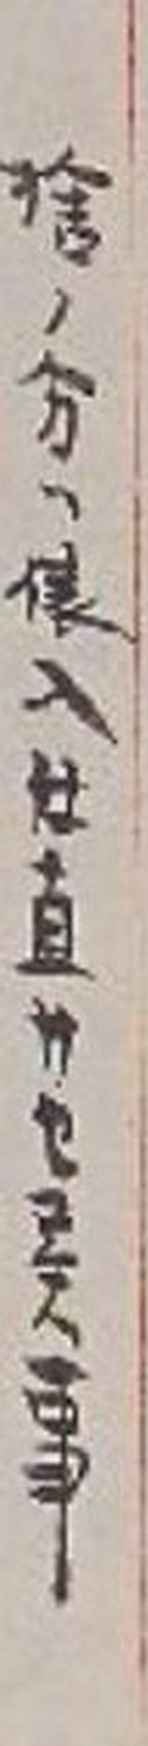捨ノ分ハ俵入仕直サセ候事
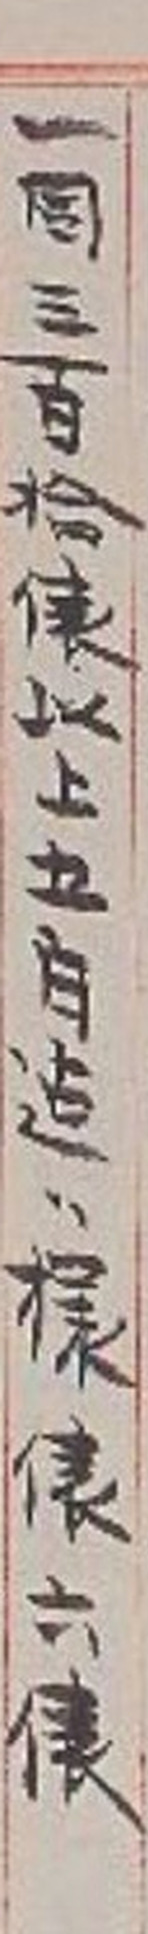一同三百拾俵以上五百迄ハ様俵六俵
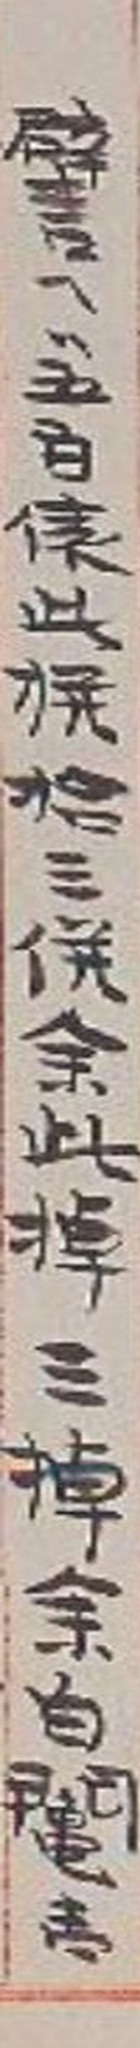譬ヘハ五百俵此栟拾三栟余此棹三棹余白鬮壱
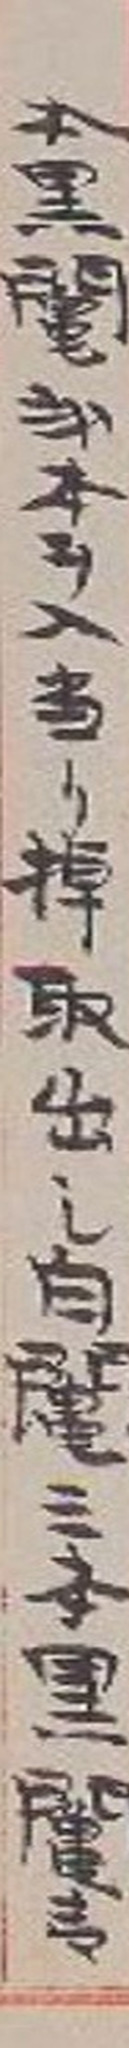本黒鬮弐本ヲ入当リ棹取出シ白鬮三本黒鬮壱

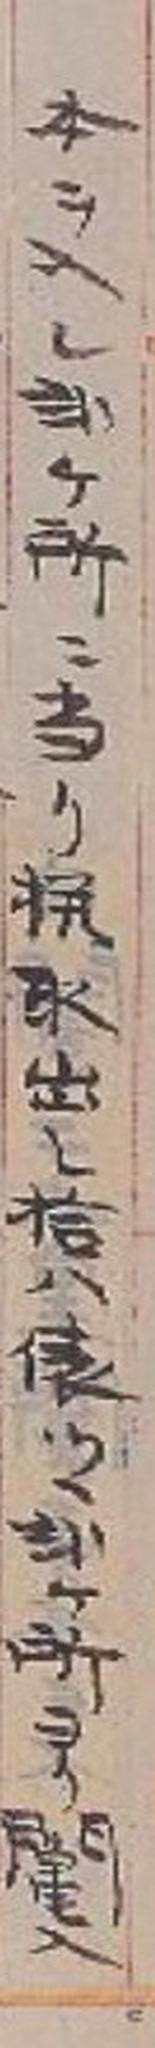本ヲ入レ弐ヶ所ニ当リ栟取出シ拾八俵ツヽ弐ヶ所ヨリ鬮入
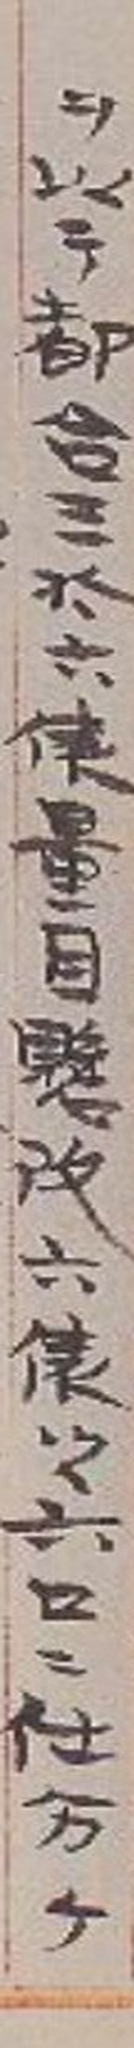ヲ以テ都合三拾六俵量目懸改六俵ツヽ六口ニ仕分ケ
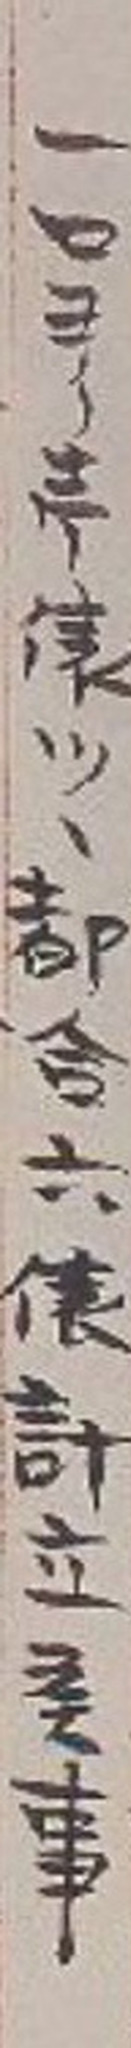一口ヨリ壱俵ツヽ都合六俵計立候事
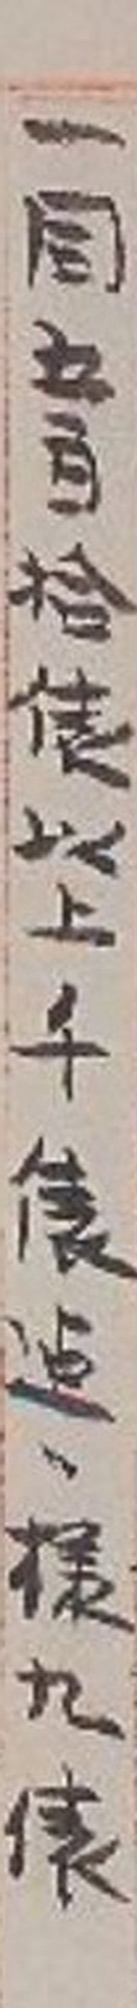一同五百拾俵以上千俵迄ハ様九俵
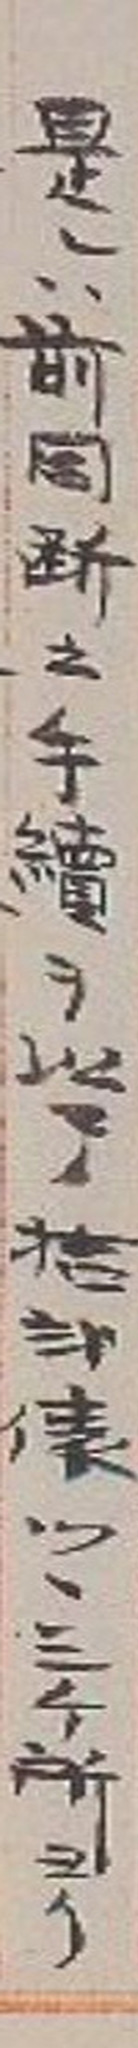是レハ前同断之手続ヲ以テ拾弐俵ツヽ三ヶ所ヨリ
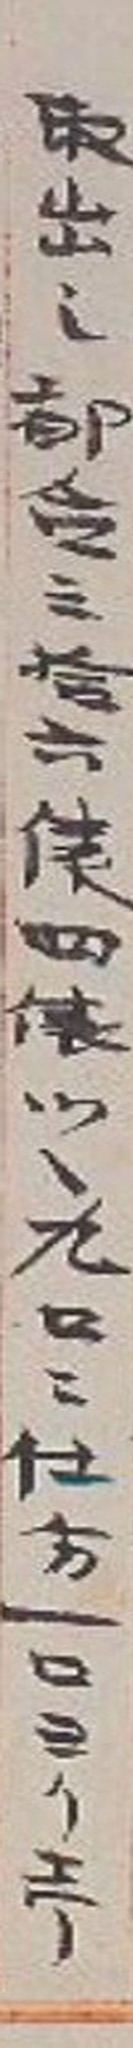取出シ都合三拾六俵四俵ツヽ九口ニ仕分一口ヨリ壱
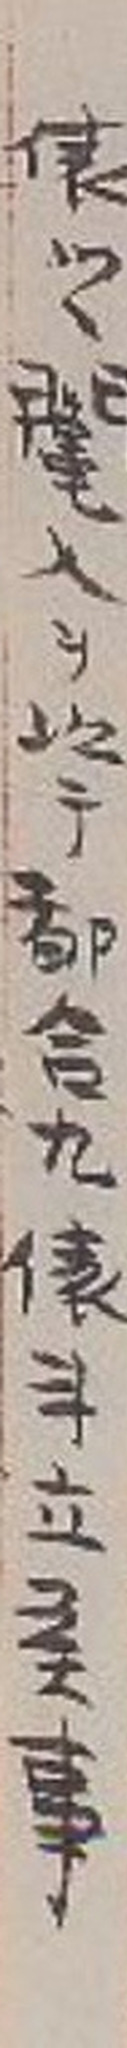俵ツヽ鬮入ヲ以テ都合九俵斗立候事
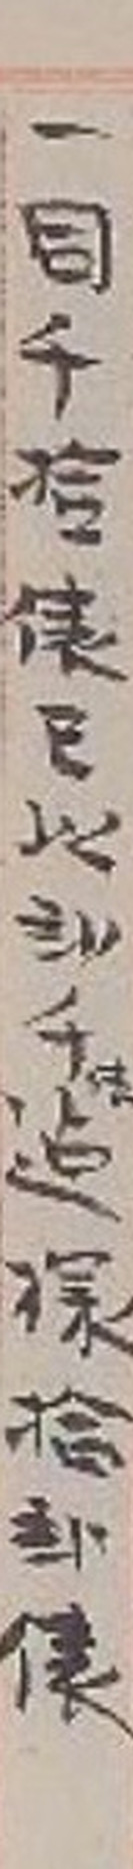一同千拾俵已以弐千俵迄様拾弐俵
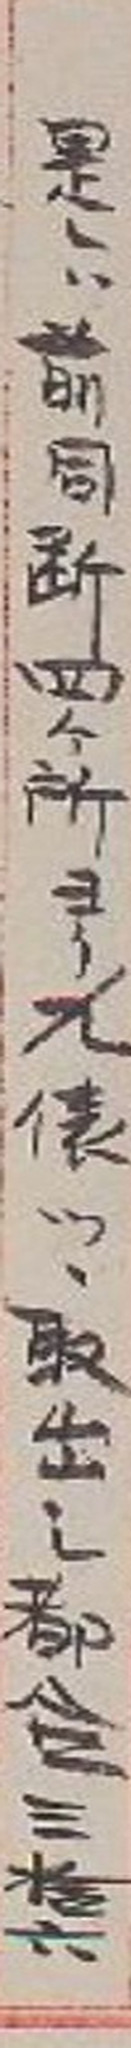是レハ前同断四ヶ所ヨリ九俵ツヽ取出シ都合三拾六
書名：貢納物品領収旧藩慣例並ニ置県後取扱順序
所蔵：University of the Ryukyus Library
